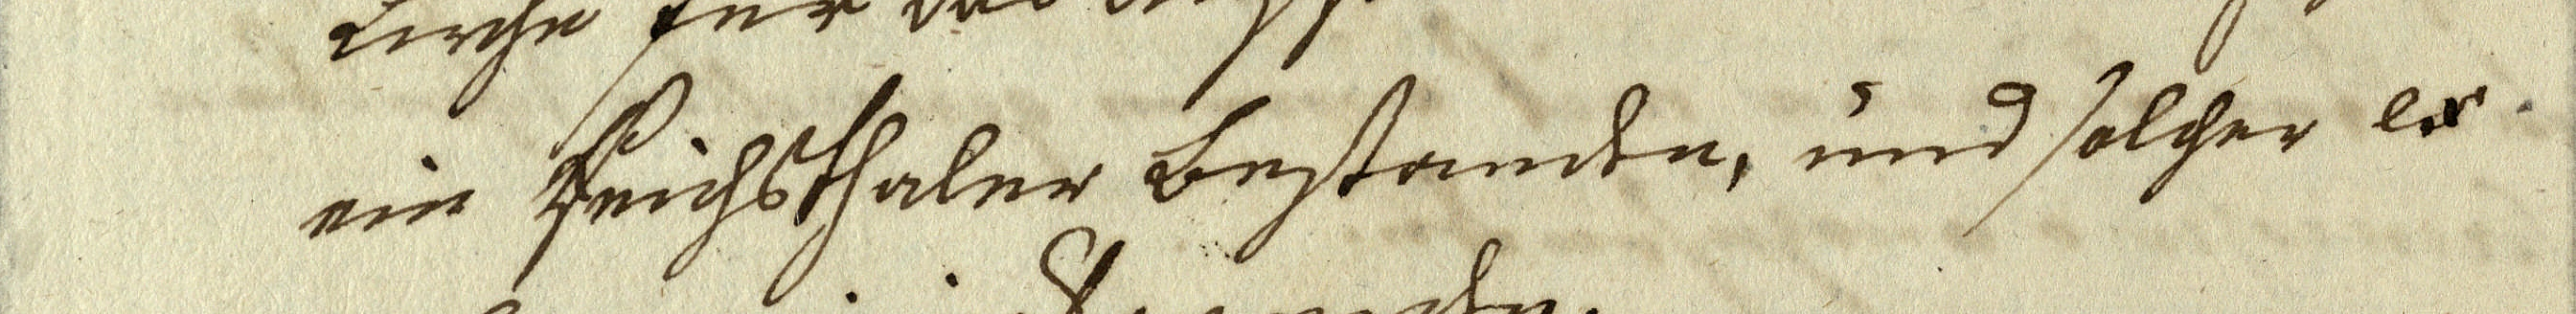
ein Reichsthaler bestanden, und solcher ex
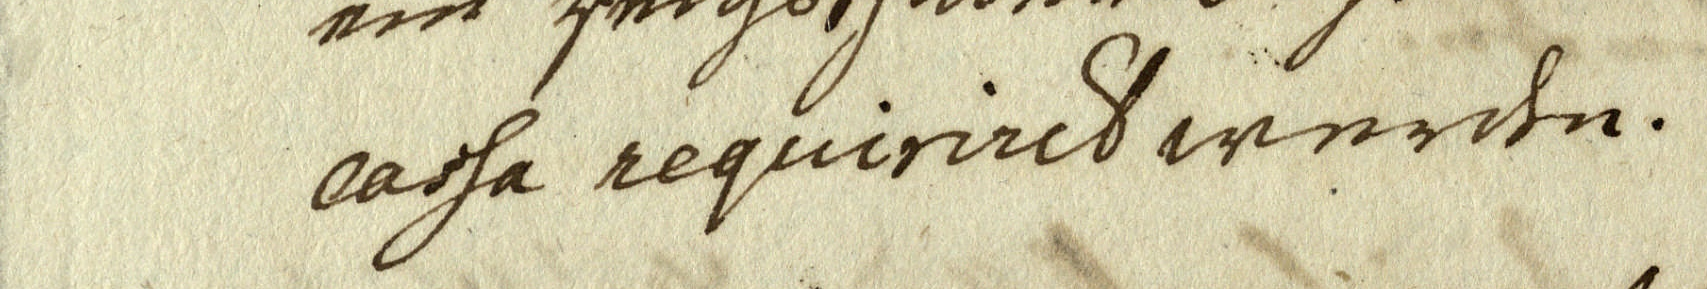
cassa requiriret werden.
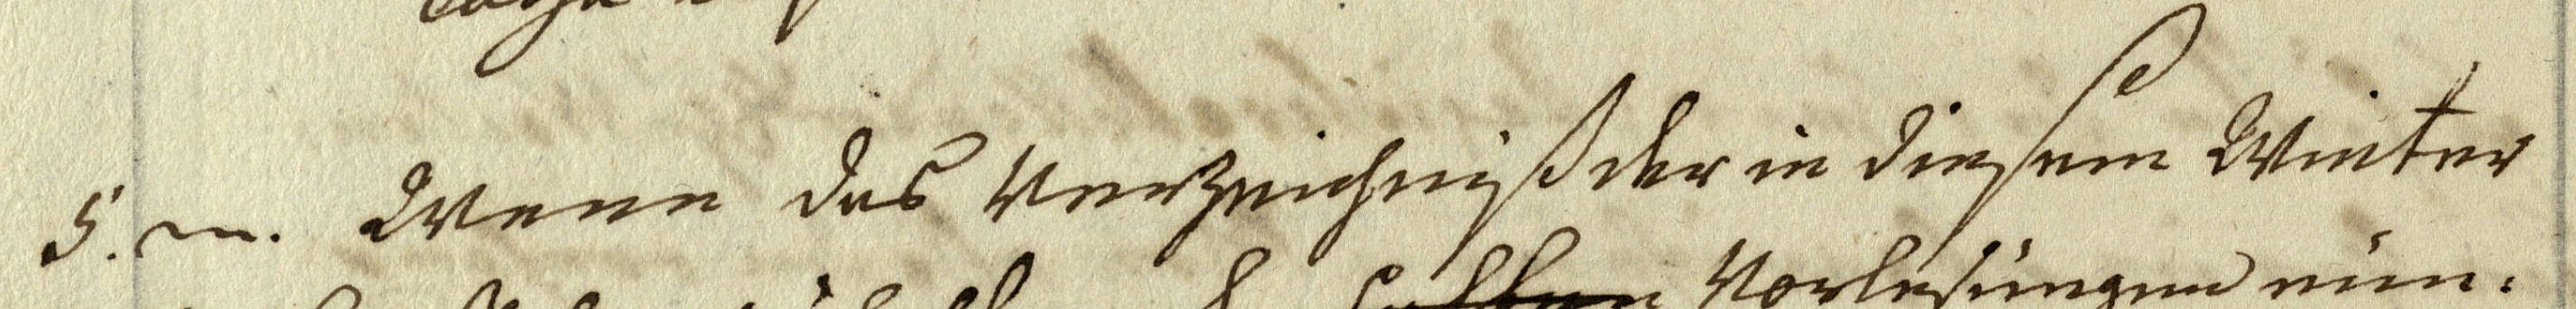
5. Wenn das Verzeichniß der in diesem Winter
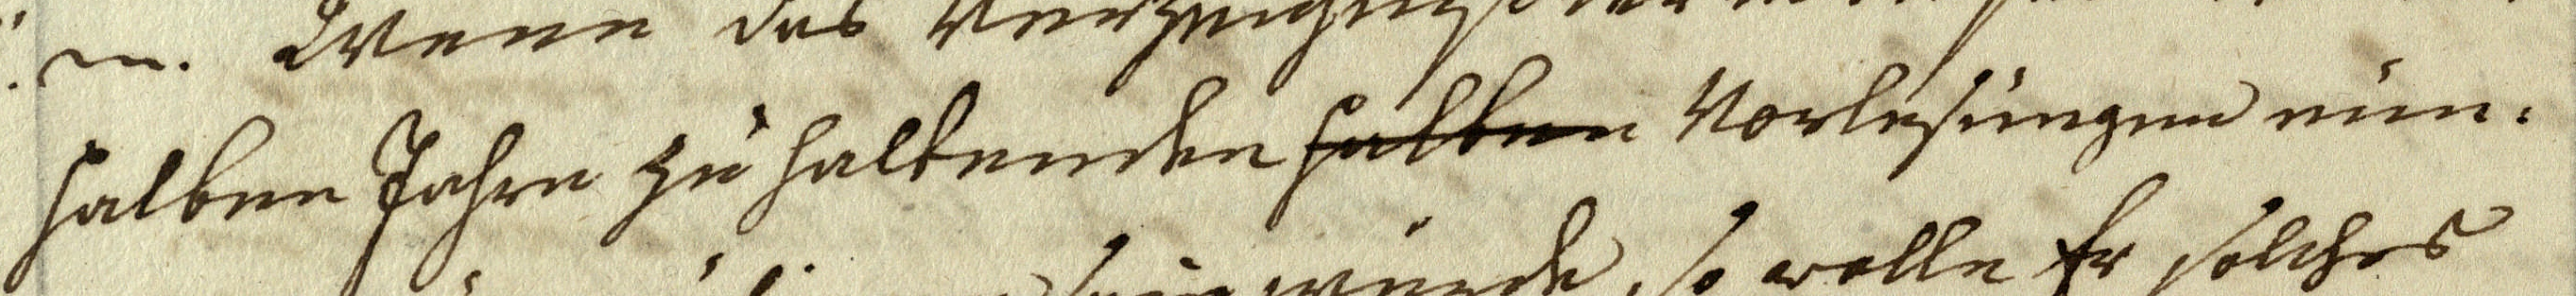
halben Jahre zu haltenden halten Vorlesungen nun¬
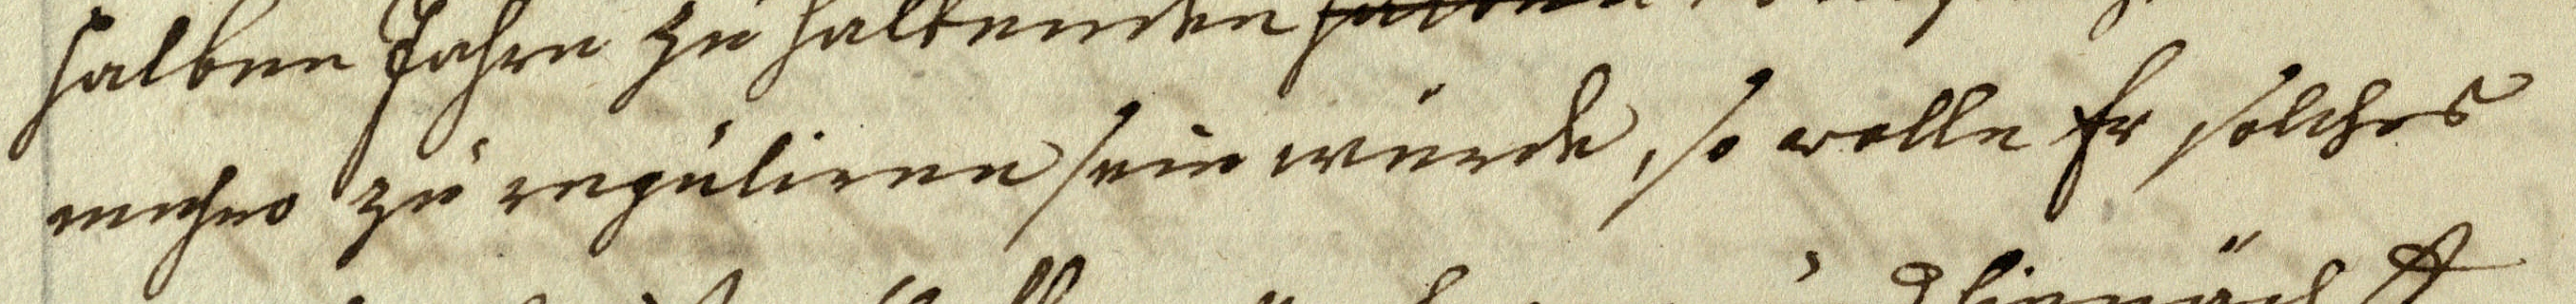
mehro zu reguliren sein würde, so wolle Er solches
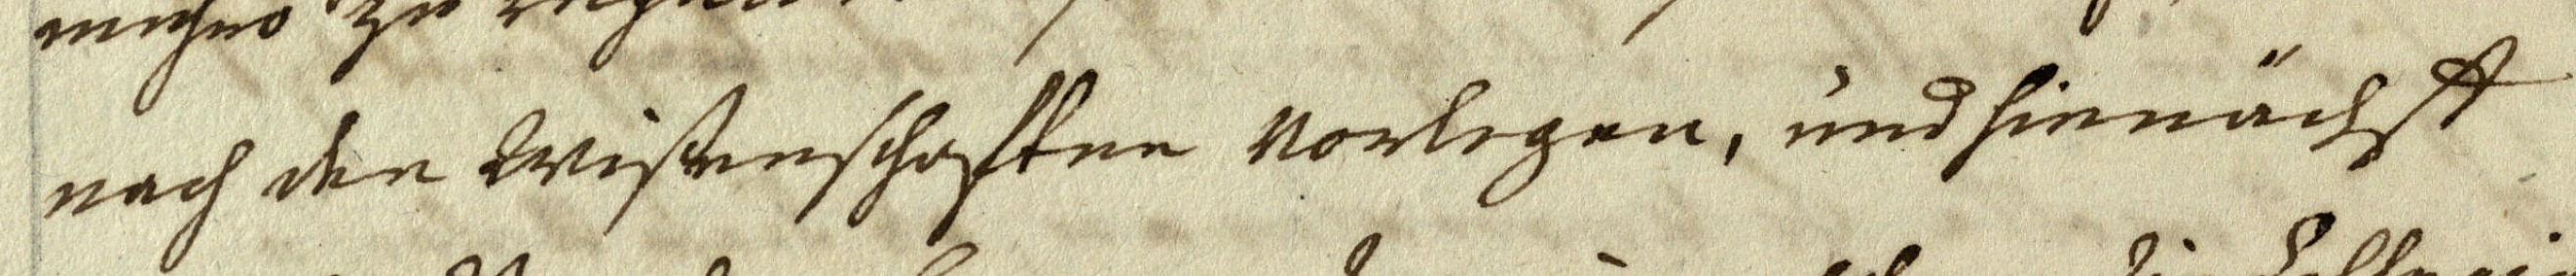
nach den Wißenschaften vorlegen, und hienächst
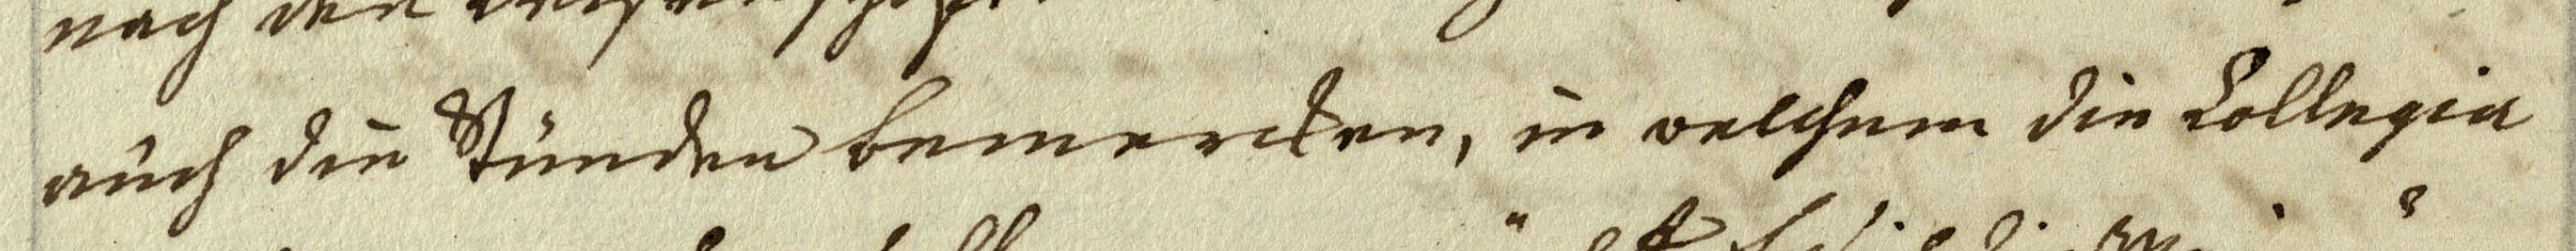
auch die Stunden bemercken, in welchem die Collegia
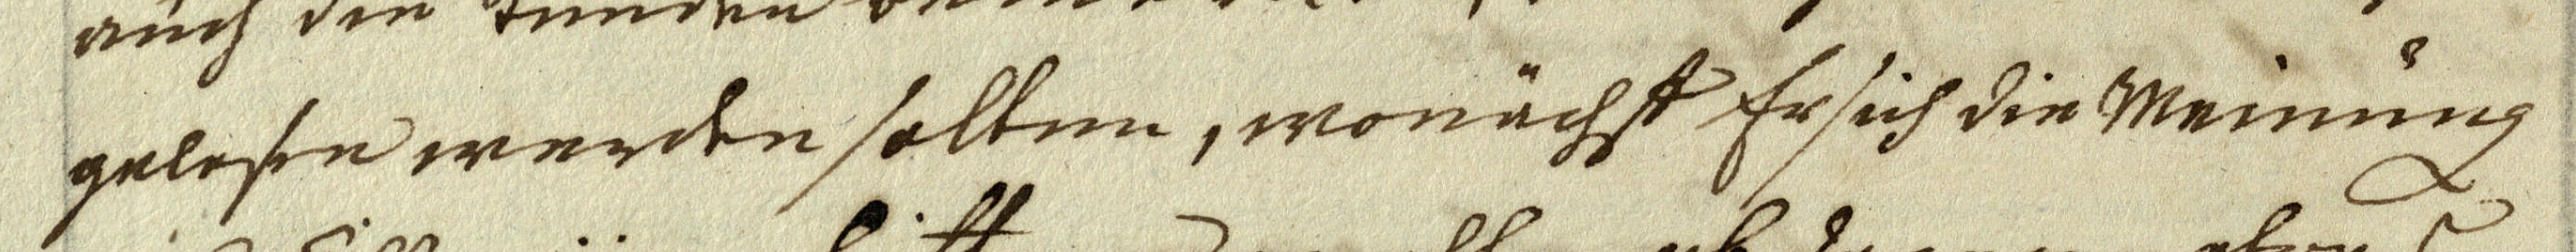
gelesen werden solten, wonächst Er sich die Meinung
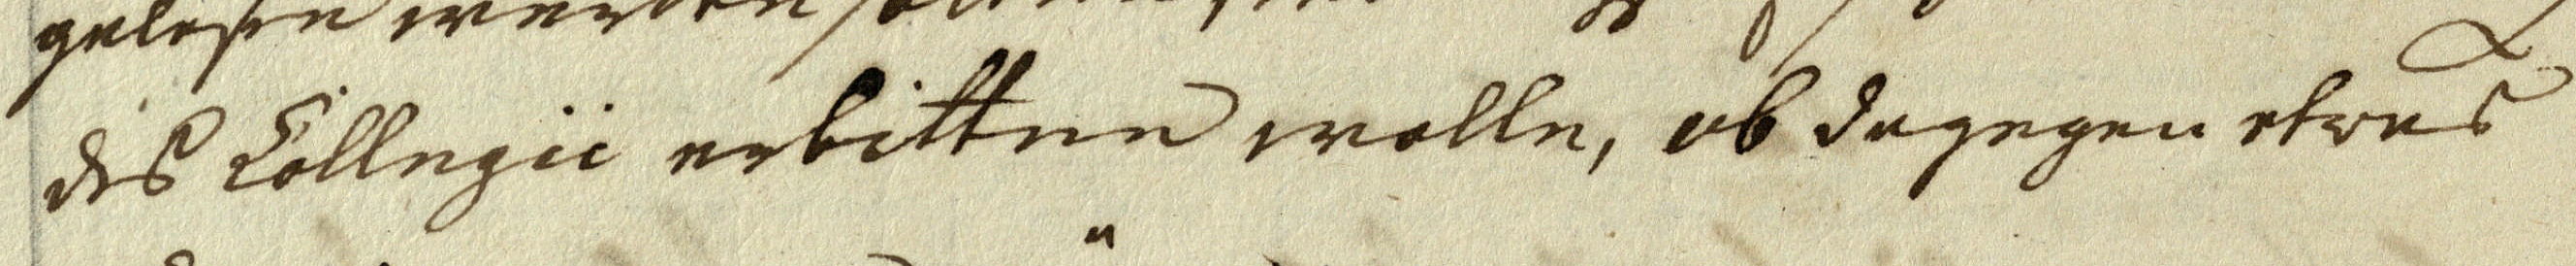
des Collegii erbitten wolle, ob dagegen etwas
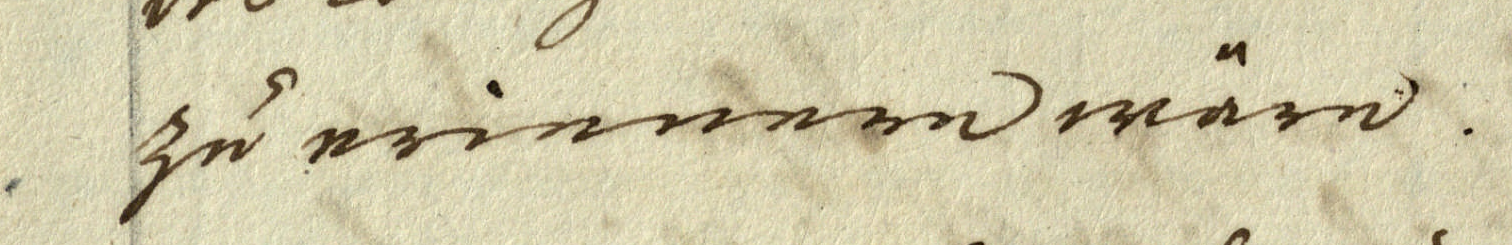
zu erinnern wäre.
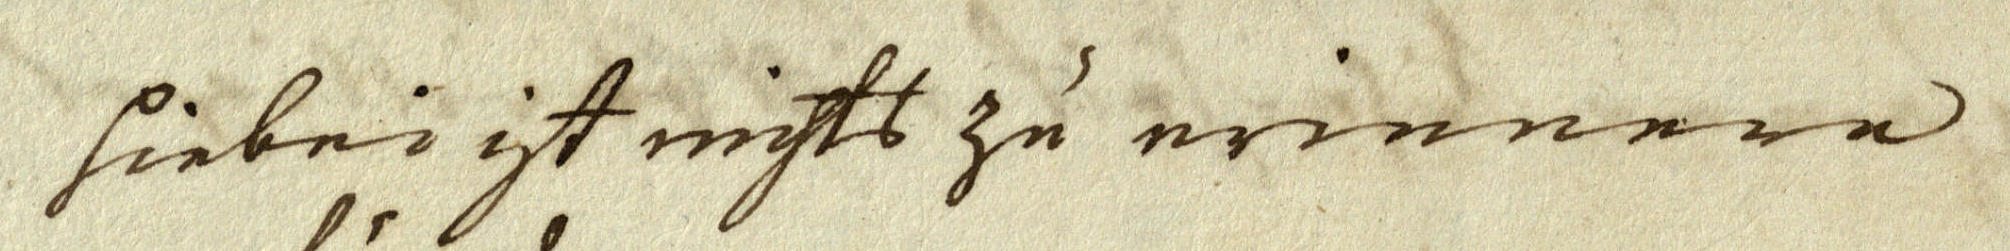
hiebei ist nichts zu erinnern
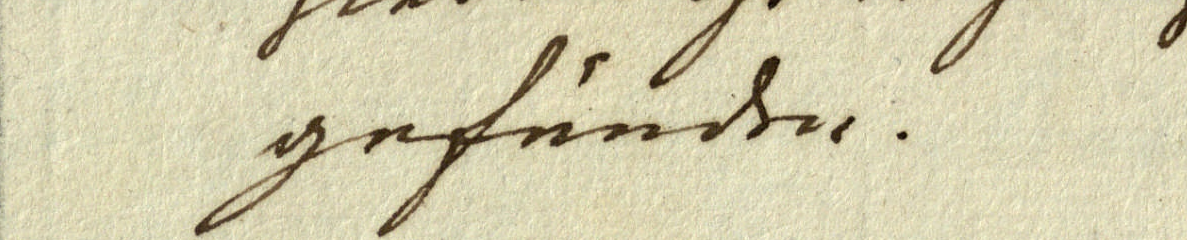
gefunden.
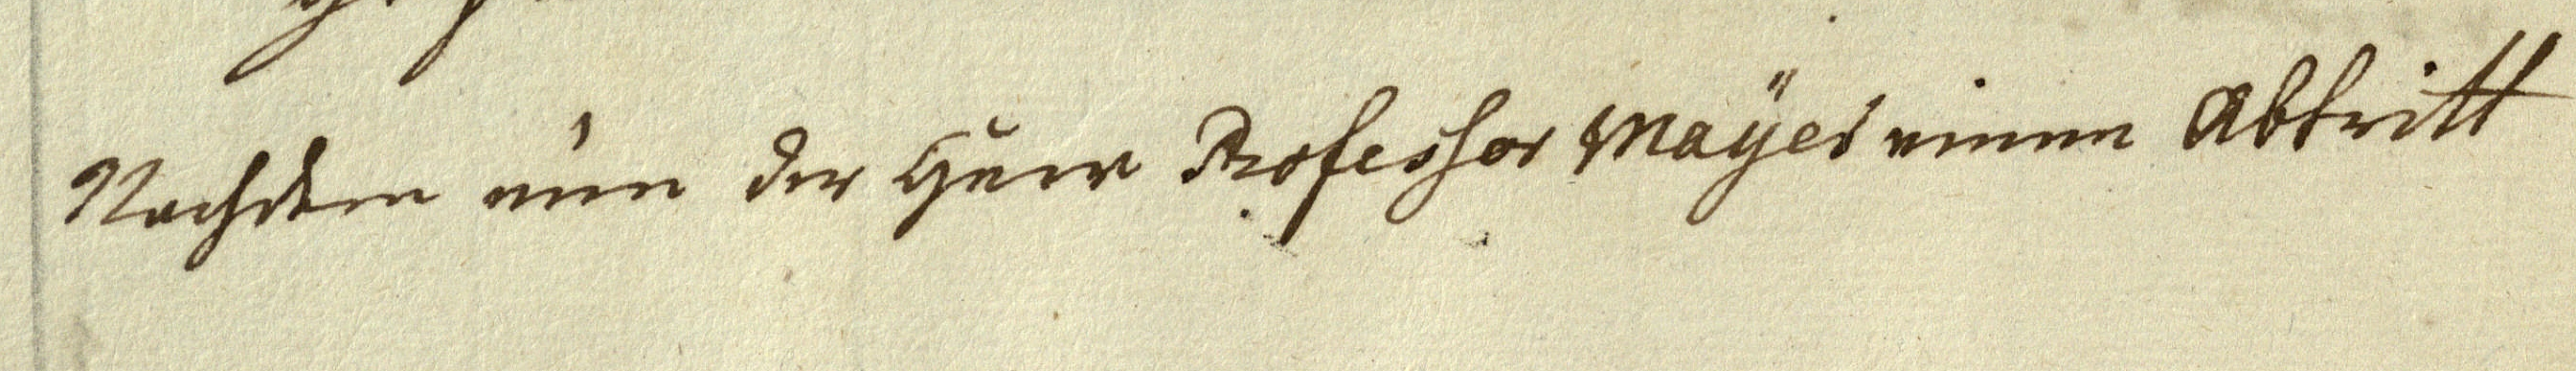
nachdem nun der Herr Professor Maÿer einen Abtritt
